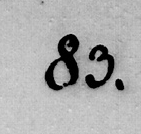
1834.
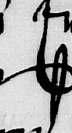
M.
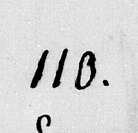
19.
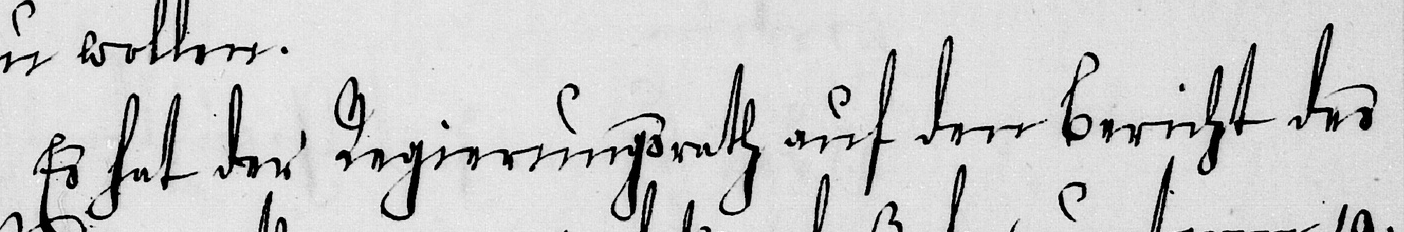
Es hat der Regierungsrath auf den Bericht des
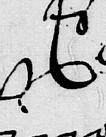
9.
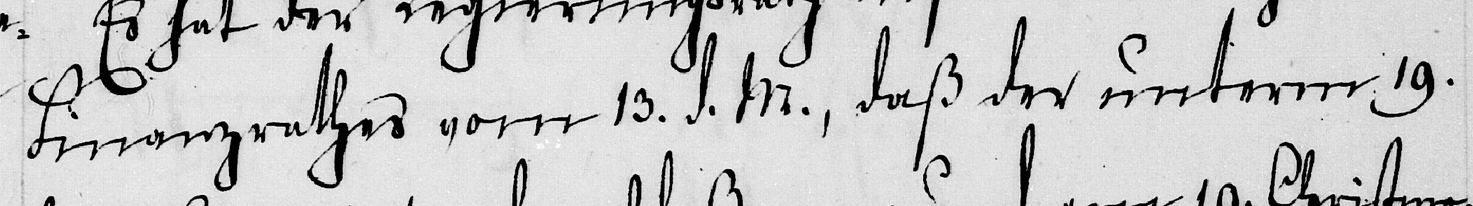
Finanzrathes vom 13. d. M., daß der unterm 19.
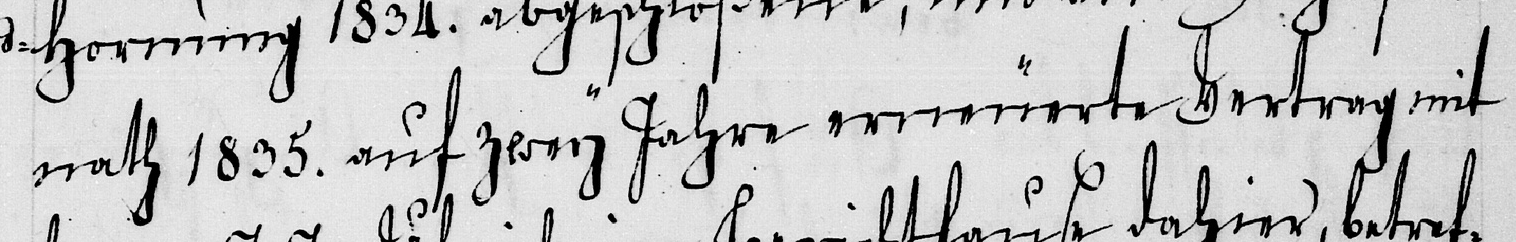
nath 1835. auf zwey Jahre erneuerte Vertrag mit
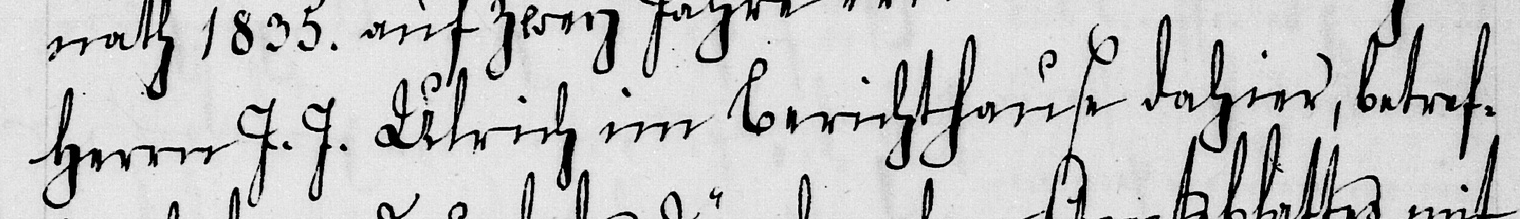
Herrn J. J. Ulrich im Berichthause dahier, betref¬
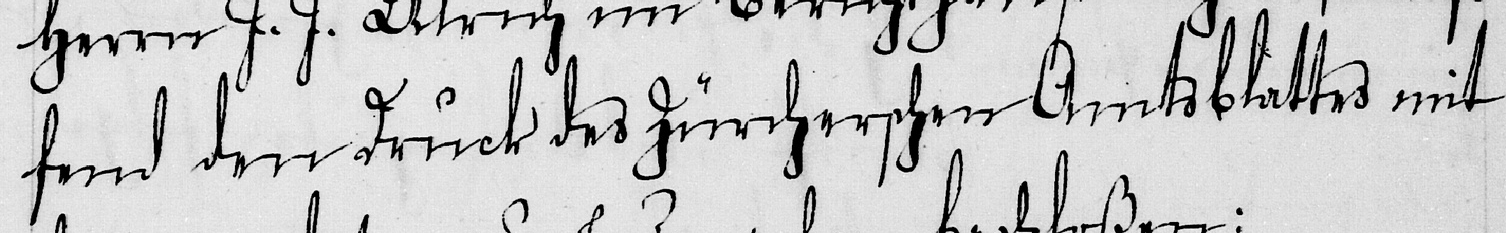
fend den Druck des Zürcherschen Amtsblattes mit
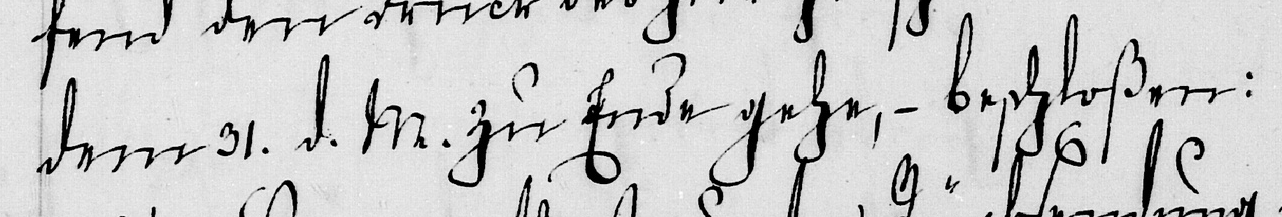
dem 31. d. M. zu Ende gehe, – beschloßen:
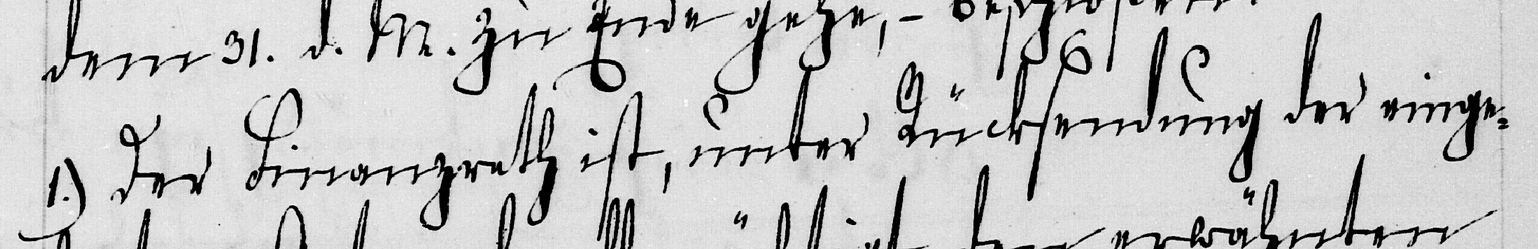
1.) Der Finanzrath ist, unter Rücksendung der einge¬
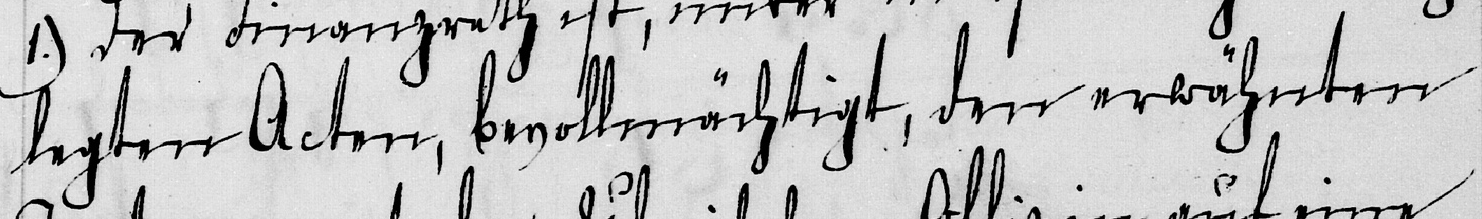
legten Acten, bevollmächtigt, den erwähnten
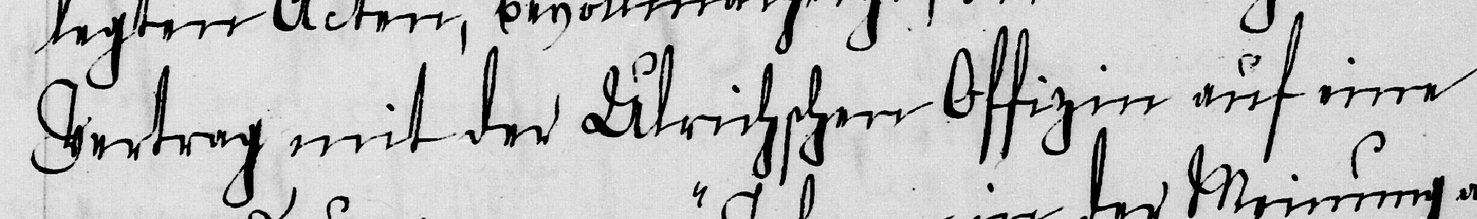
Vertrag mit der Ulrichschen Offizin auf eine
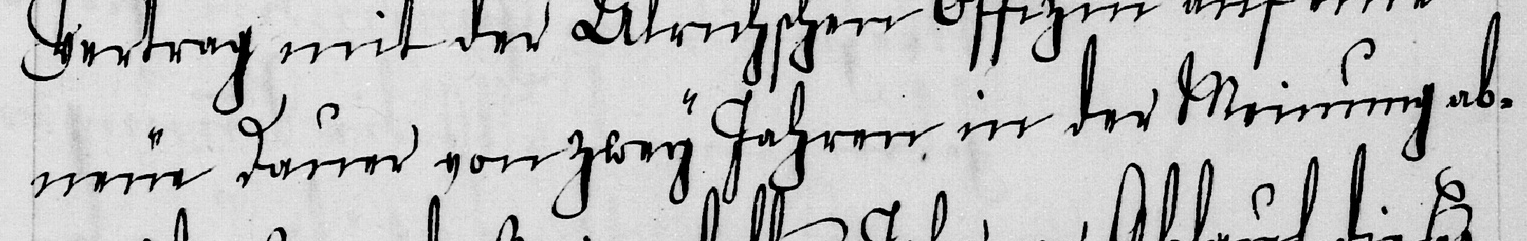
neue Dauer von zwey Jahren in der Meinung ab¬
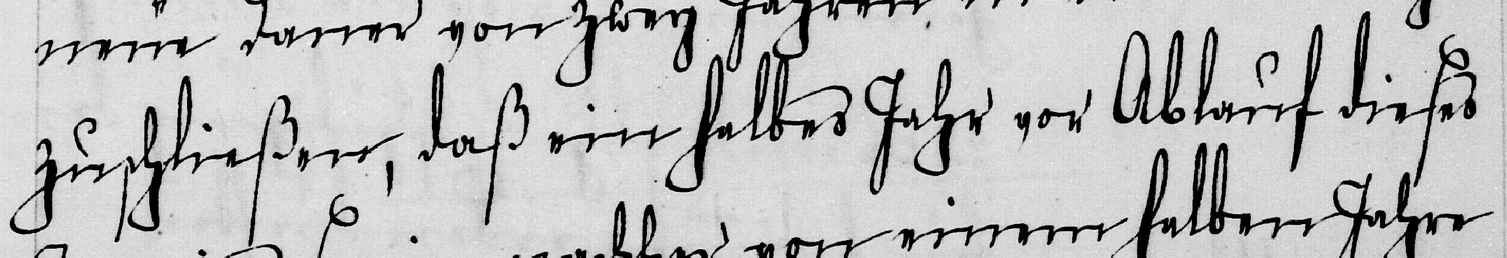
zuschließen, daß ein halbes Jahr vor Ablauf dieses
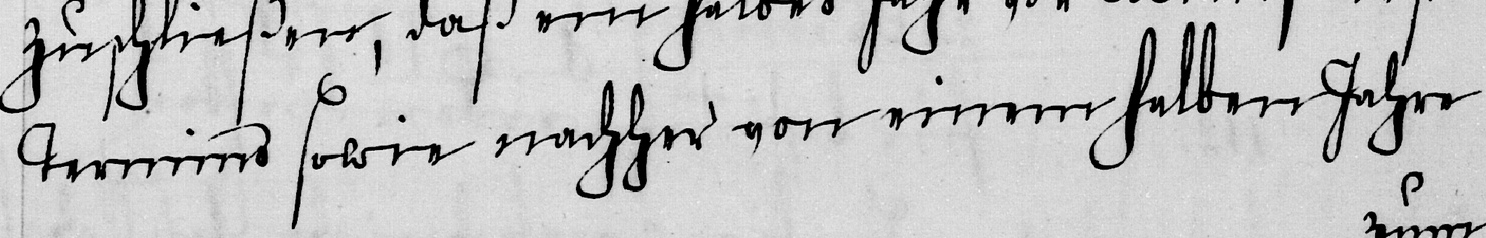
Termins sowie nachher von einem halben Jahre
